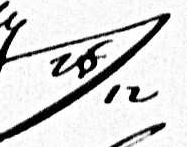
28/12
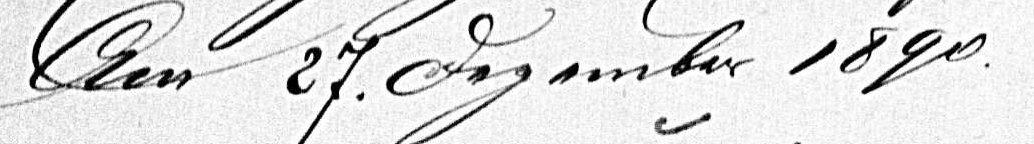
Am 27. Dezember 1890.
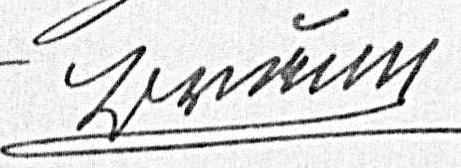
Braun
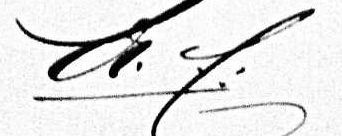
A. E.
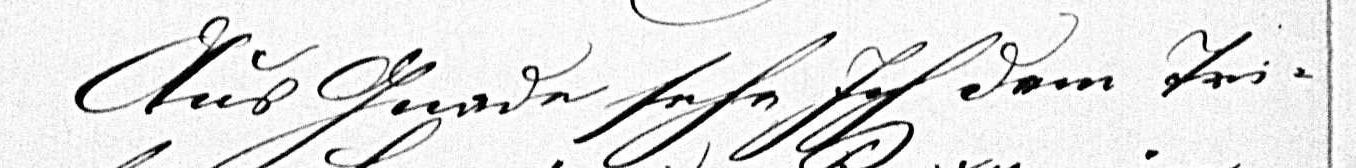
Aus Gnade sehe Jch dem Tri¬
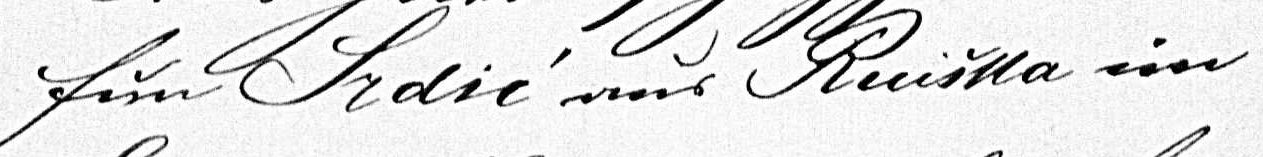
fun Srdić aus Ruiška im
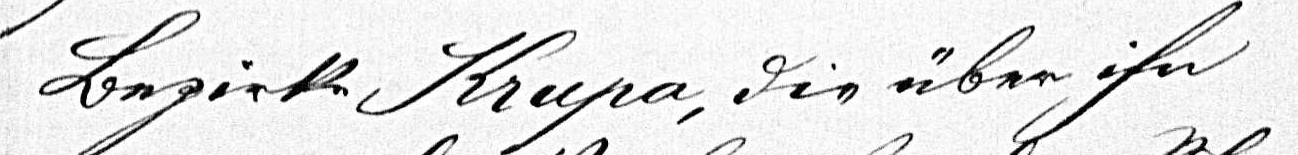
Bezirke Krupa, die über ihn
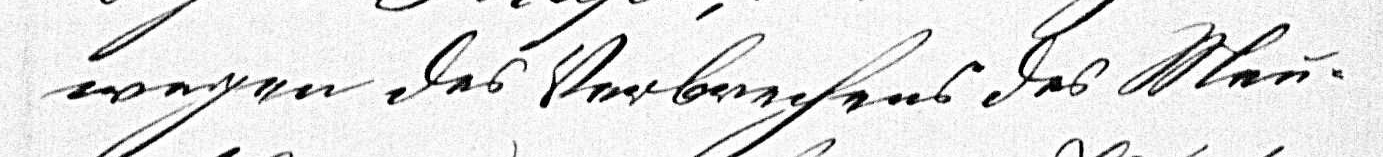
wegen des Verbrechens des Meu¬
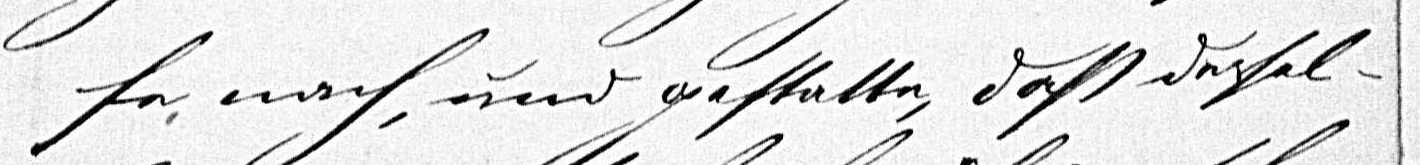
fe, nach, und gestatte, daß dersel¬
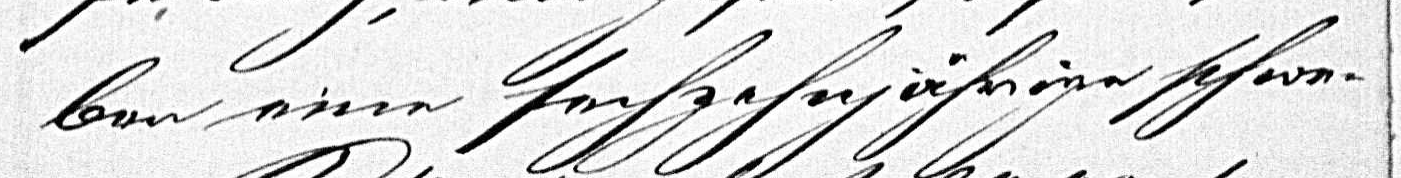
ben eine sechzehnjährige schwe¬
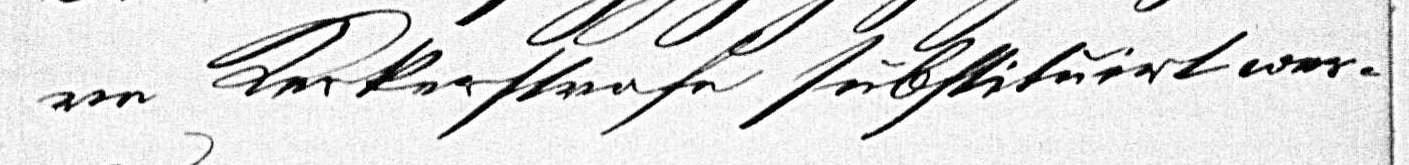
re Kerkerstrafe substituirt wer¬
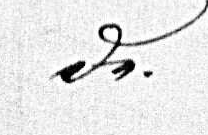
de.
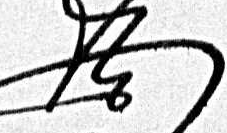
xx
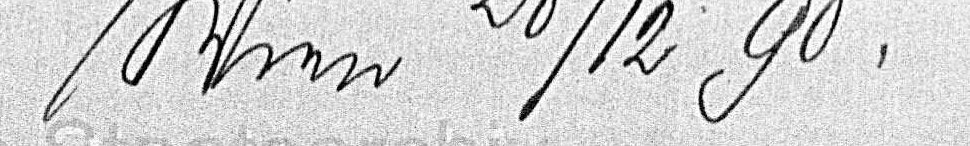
Wien 28/12 90.
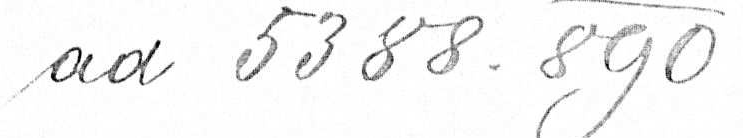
ad 5388. 890
